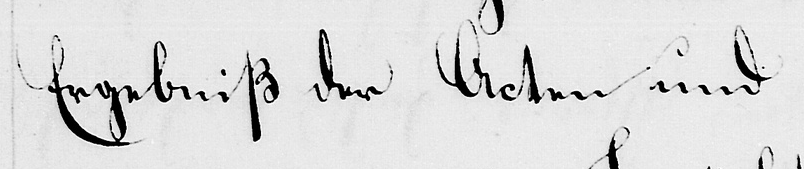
Ergebniß der Acten und
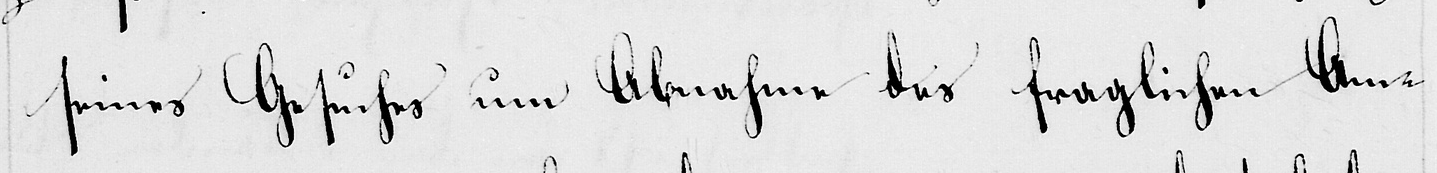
seines Gesuches um Abnahme des fraglichen Am¬
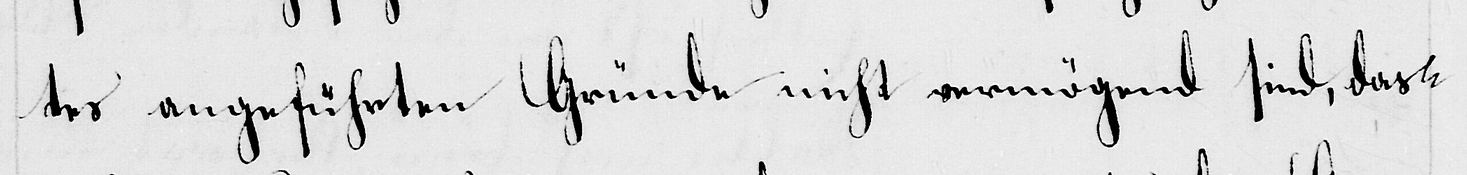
tes angeführten Gründe nicht vermögend sind, das¬
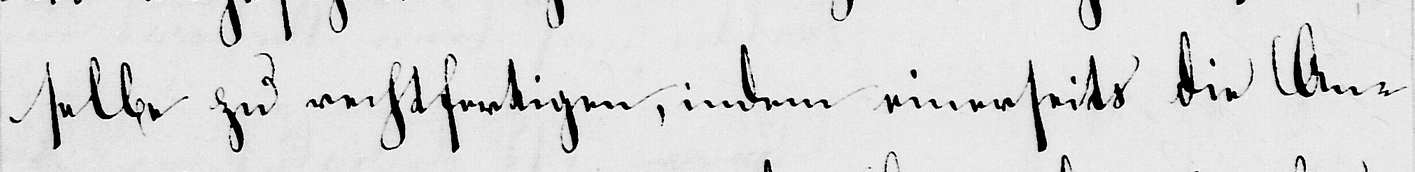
selbe zu rechtfertigen, indem einerseits die An¬
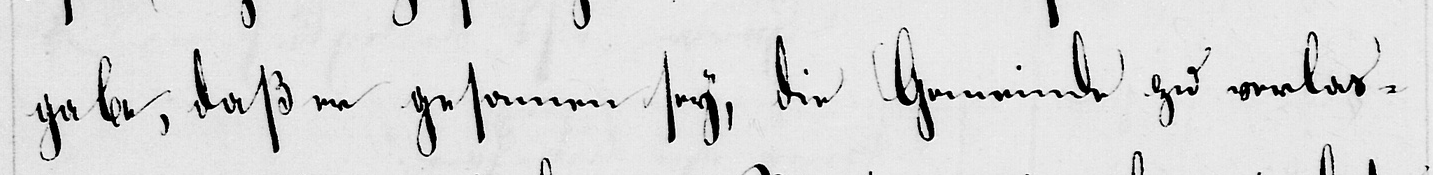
gabe, daß er gesonnen sey, die Gemeinde zu verlas¬
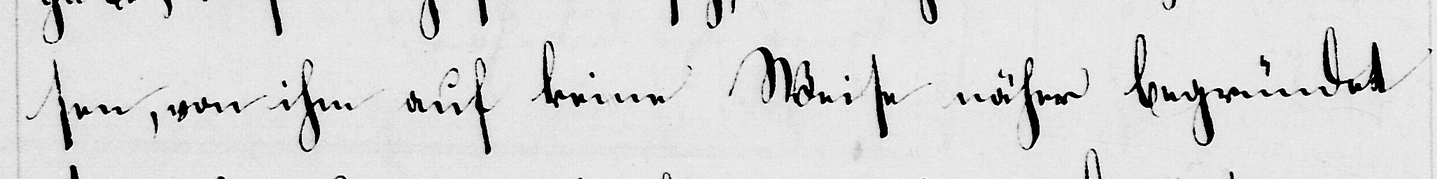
sen, von ihm auf keine Weise näher begründet
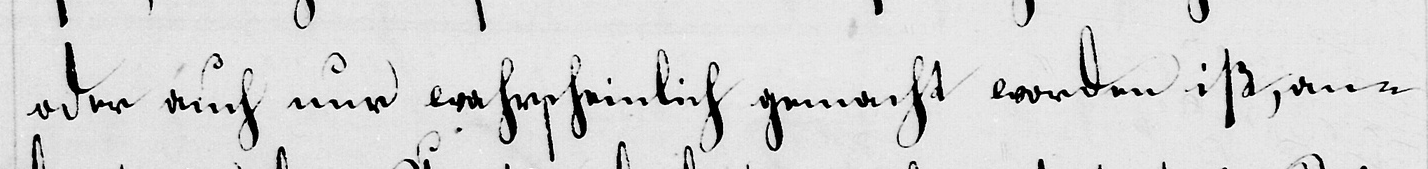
oder auch nur wahrscheinlich gemacht worden ist, an¬
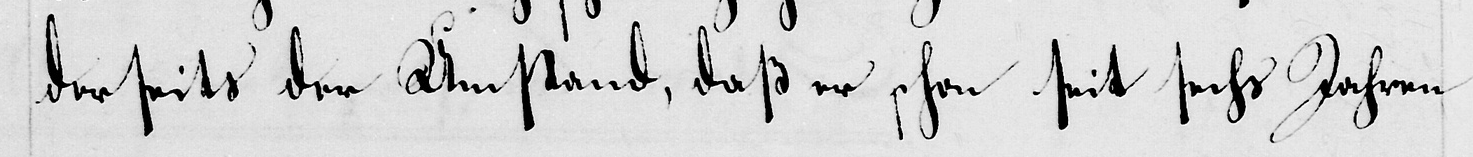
derseits der Umstand, daß er schon seit sechs Jahren
